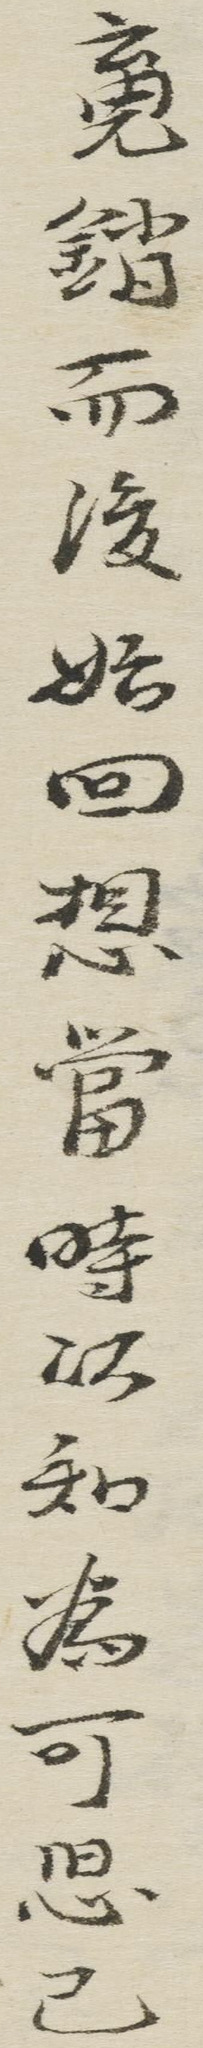鬼鎖而後始回想当時以知為可思己
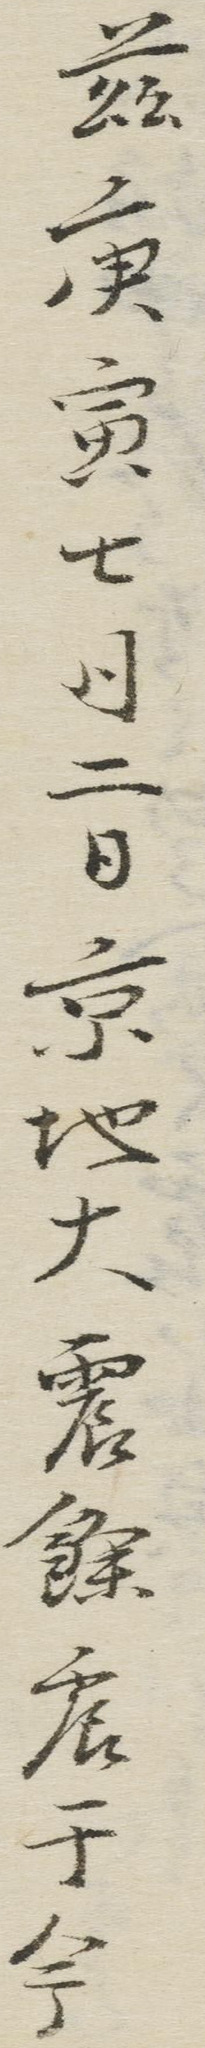茲庚寅七月二日京地大震余震于今
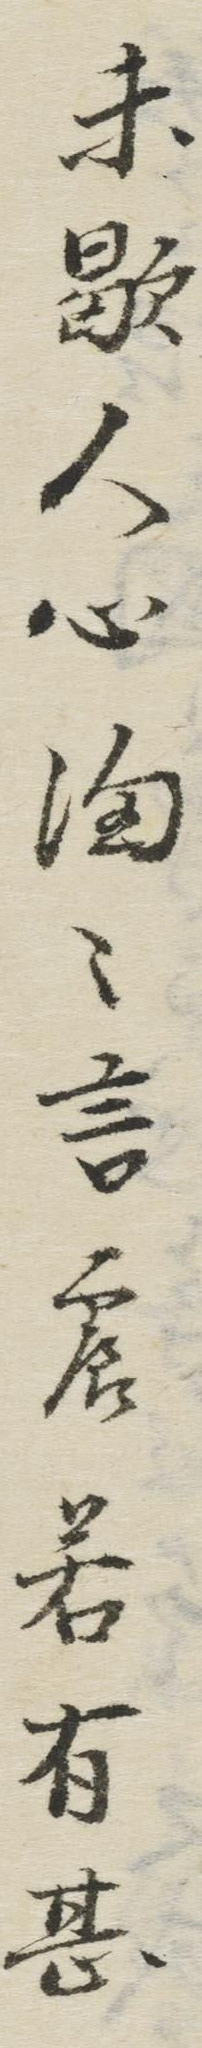未歇人心洶々言震若有甚
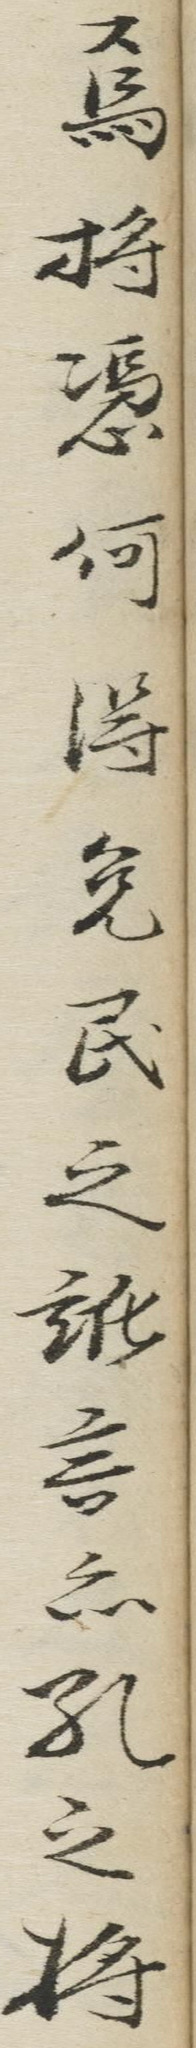焉将憑何得兌民之訛言亦孔之将
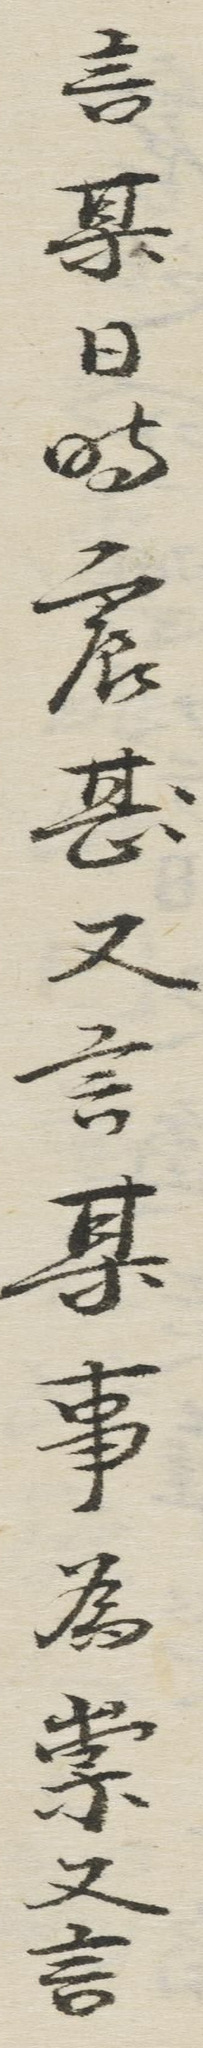言某日時震甚又言某事為祟又言
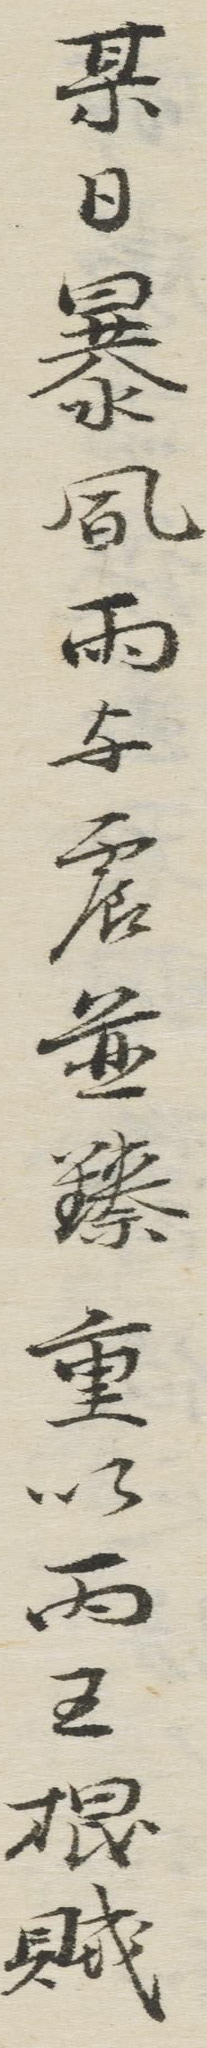某日暴風雨与震並臻重以丙王根賊
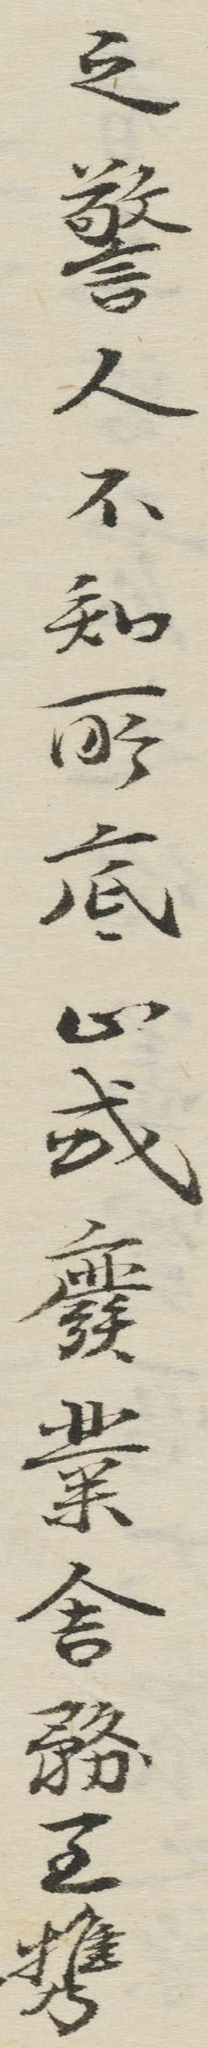之警人不知所底心或廃業舎務至携
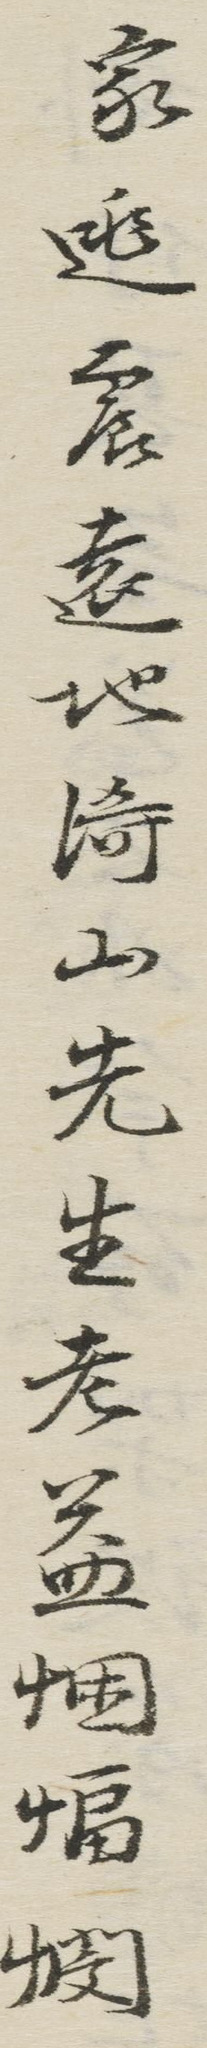家逃震遠地涛山先生老益悃幅憫
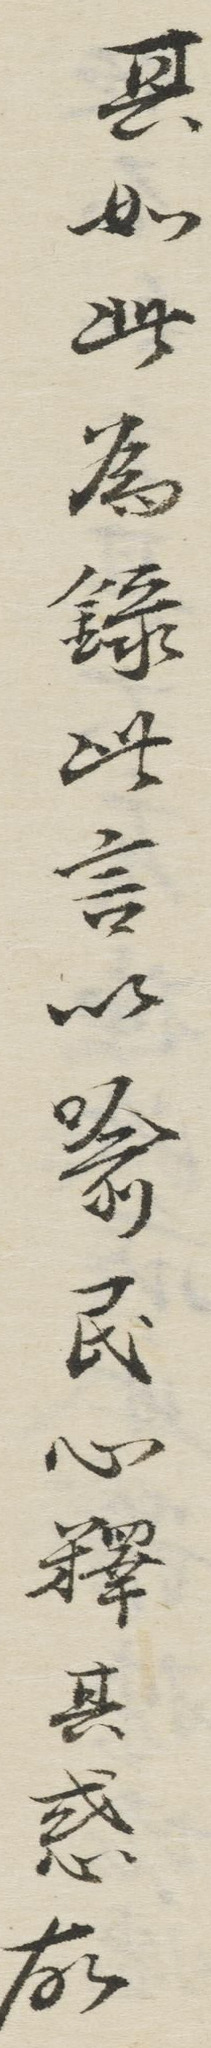其如此為録此言以喩民心釈其惑故
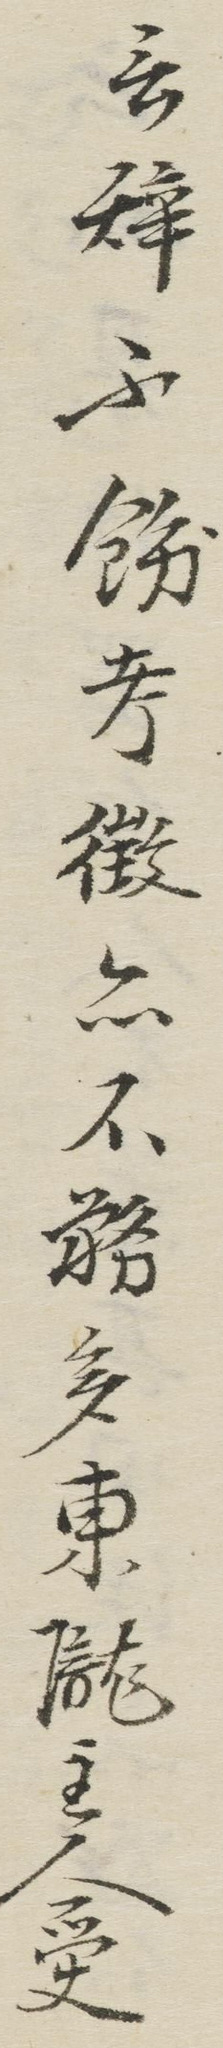言辞不飾考徴亦不務多東瀧主人受
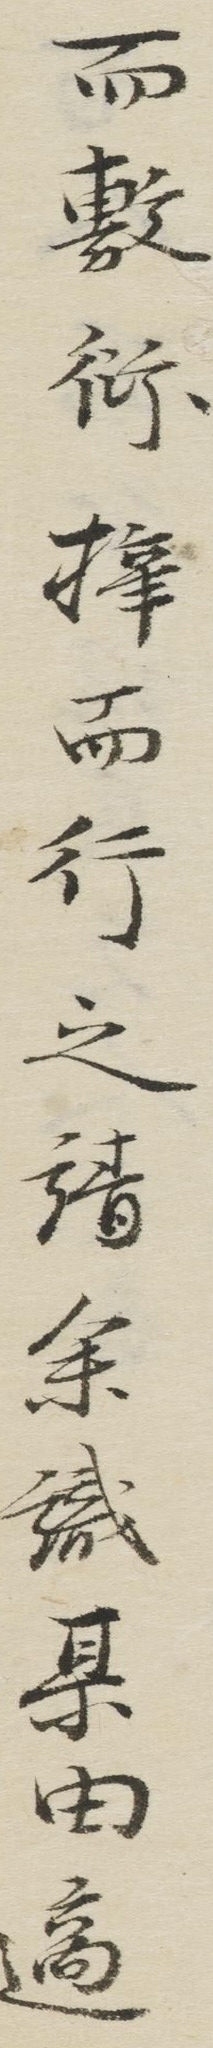而敷衍択而行之請余識某由適

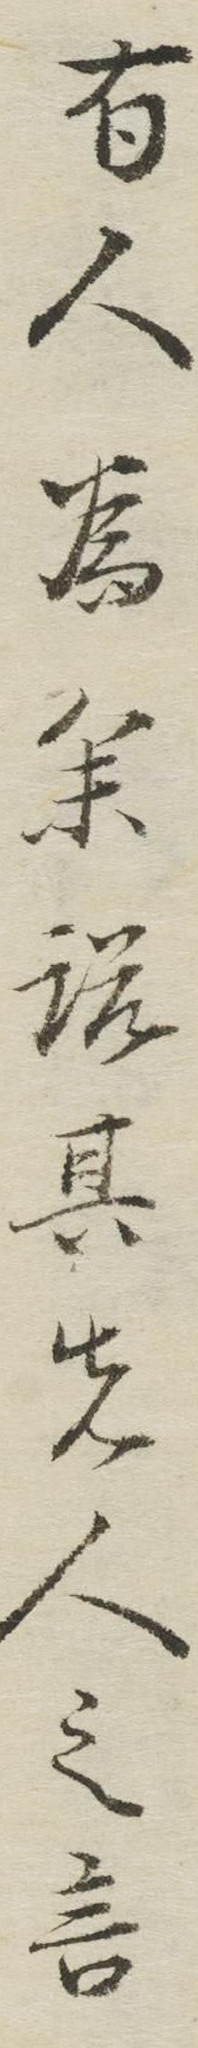有人為余説其先人の言
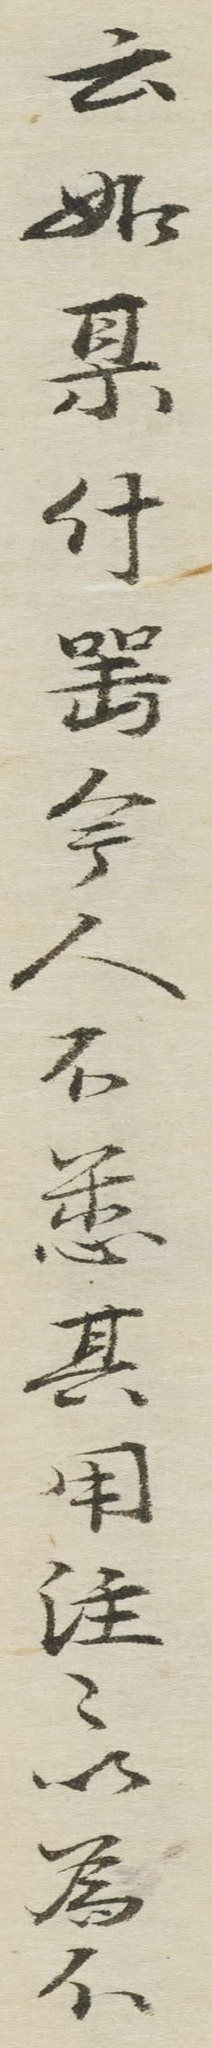云始某什器今人不悉其用注以為不
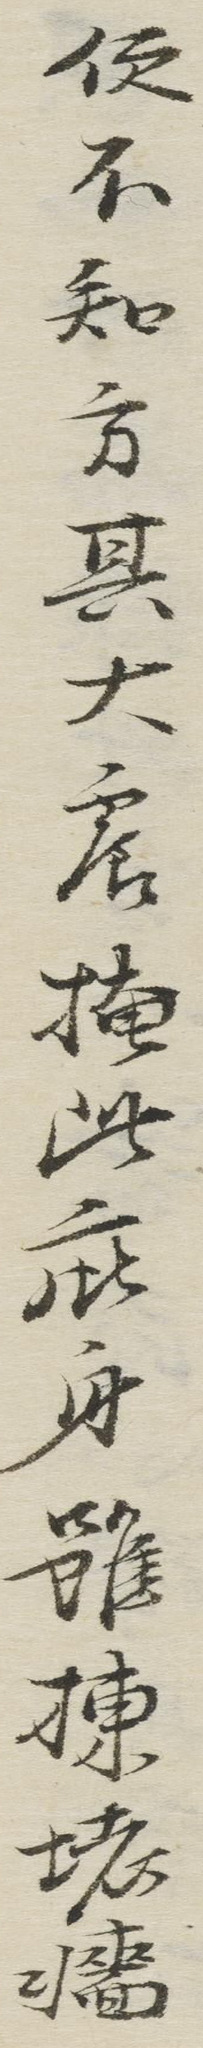便不知方其大震掩此庇身雖棟堵牆
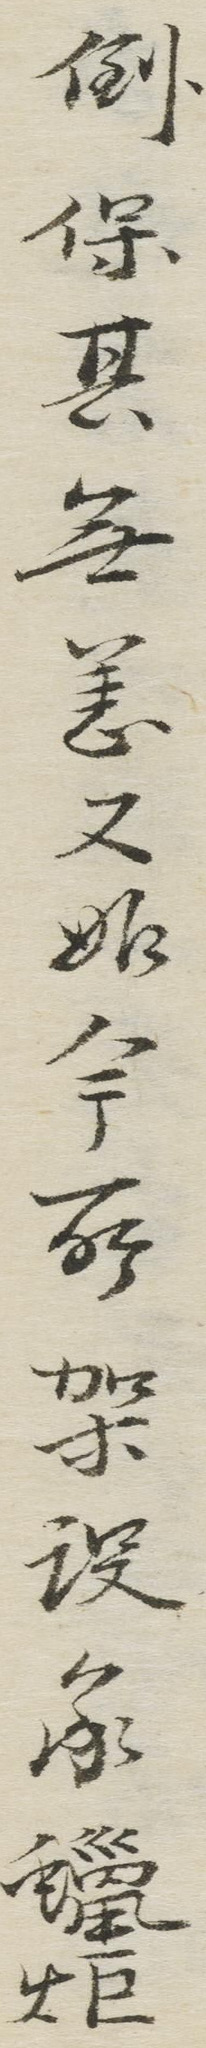倒保其無恙又始今所架設承蠟炬
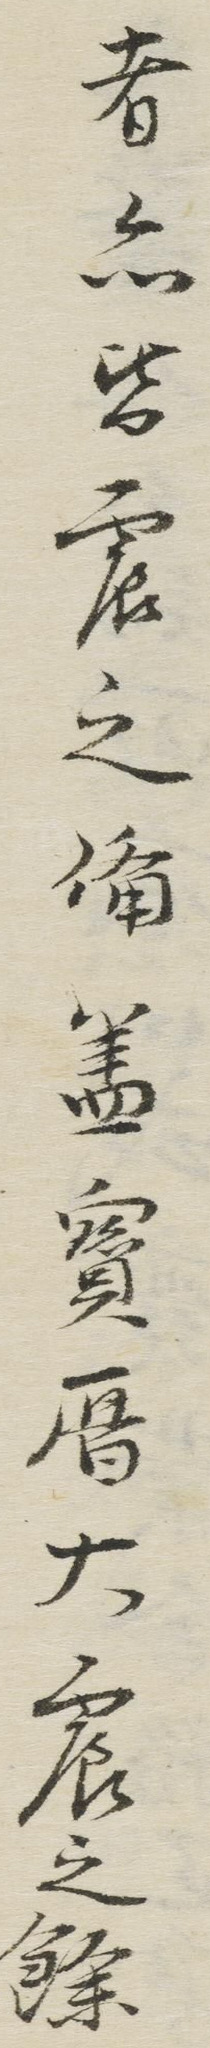者亦皆震之備蓋宝暦大震之余
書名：諸国大地震大津波一代記
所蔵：東京大学地震研究所図書室 Earthquake Research Institute Library, The University of Tokyo, JAPAN
